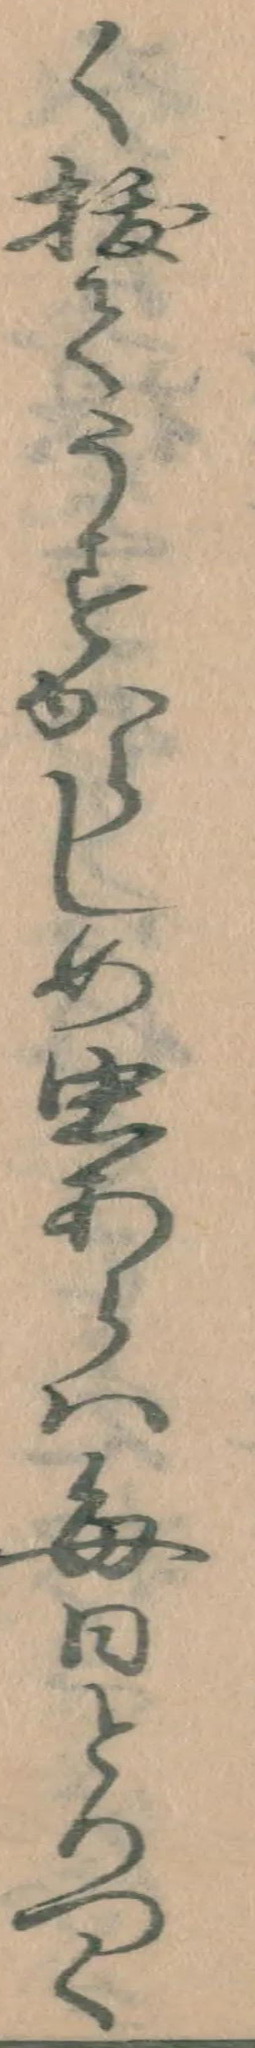く抜てうすからしめ虫あらは毎日とりつく
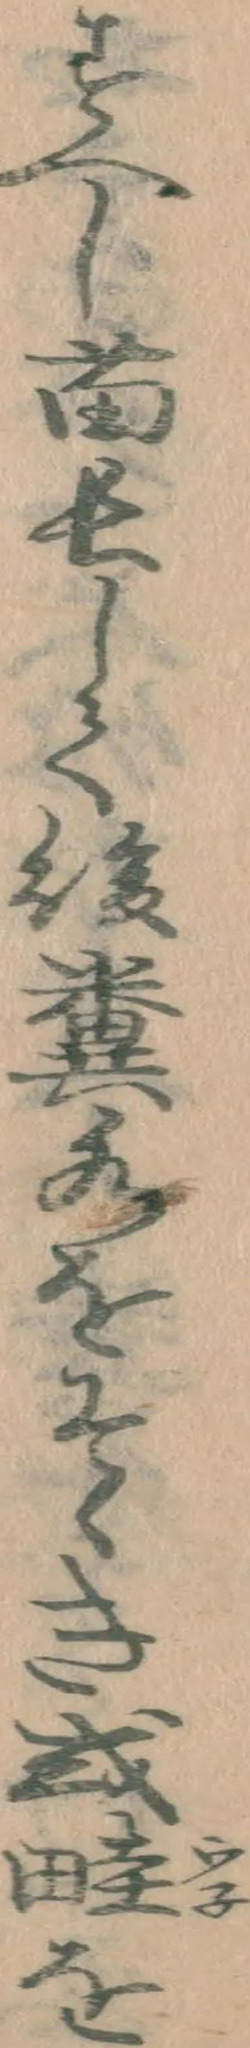すへし苗長して後糞水をそゝき或畦を
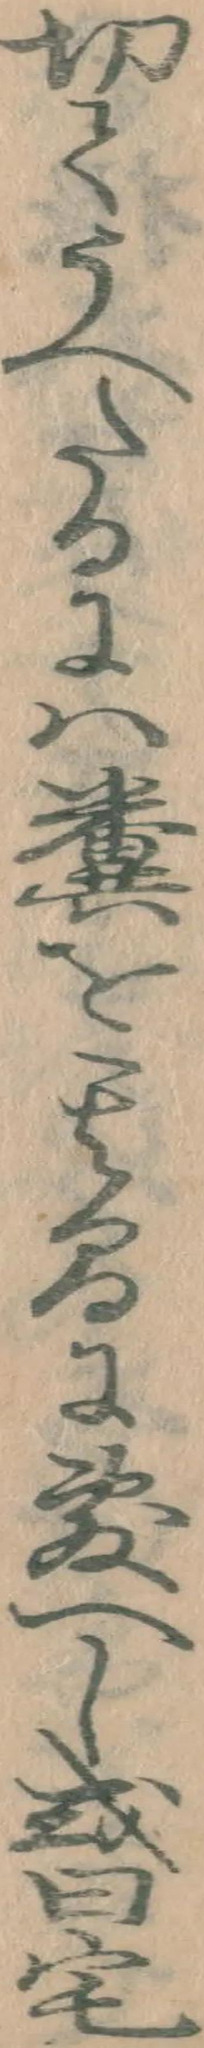切てうへたるには糞を其間に敷へし或曰宅
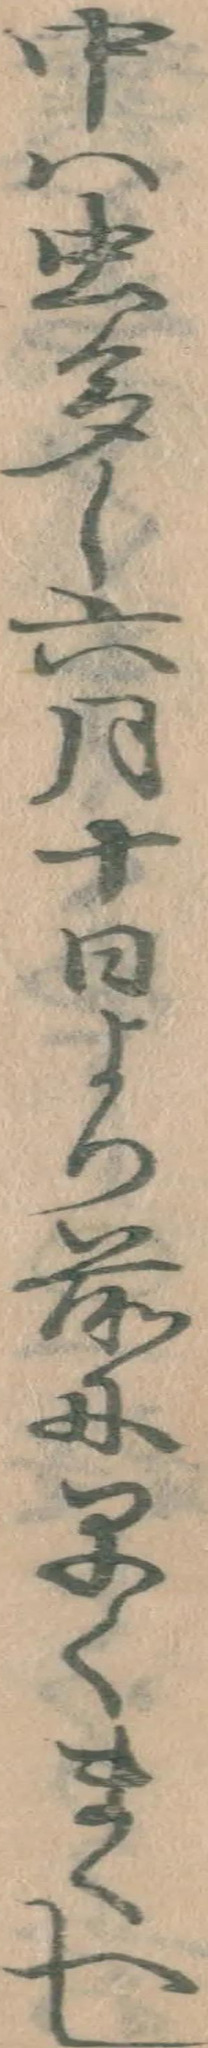中は虫多し六月十日より前に早くまくへし
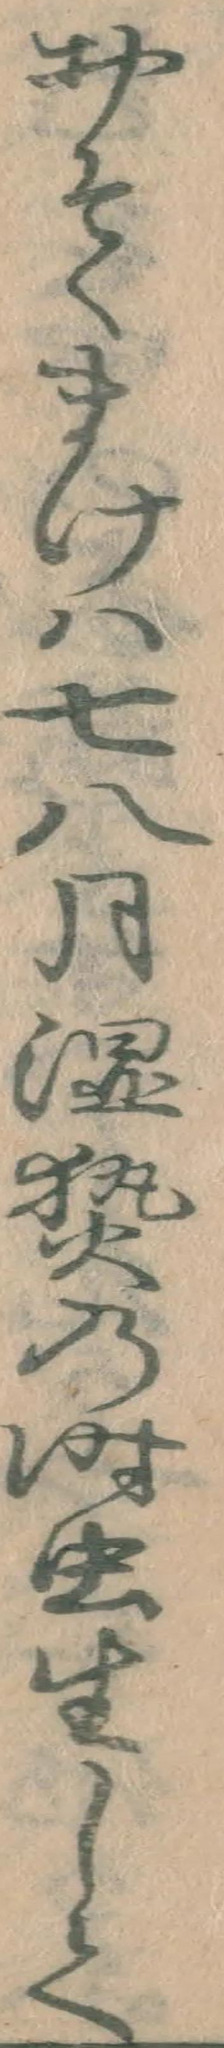おそくまけは七八月湿熟の時虫生して
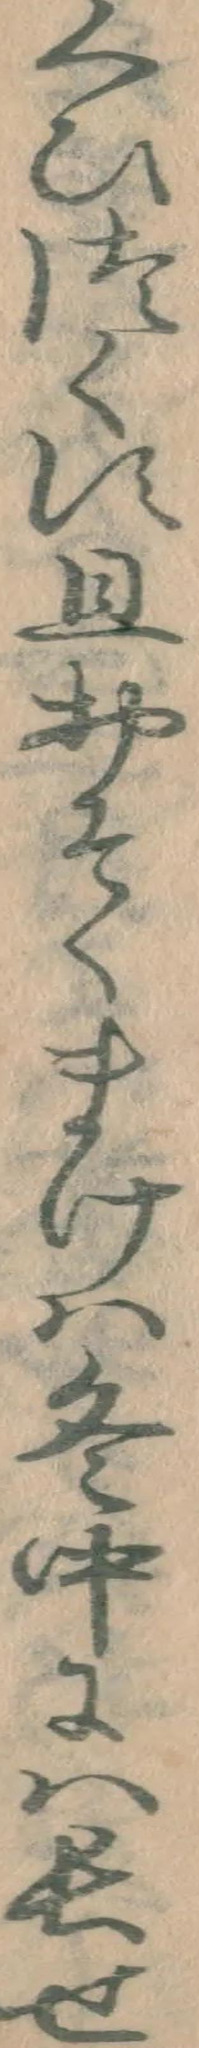くひつくす且おそくまけは冬中には長せ
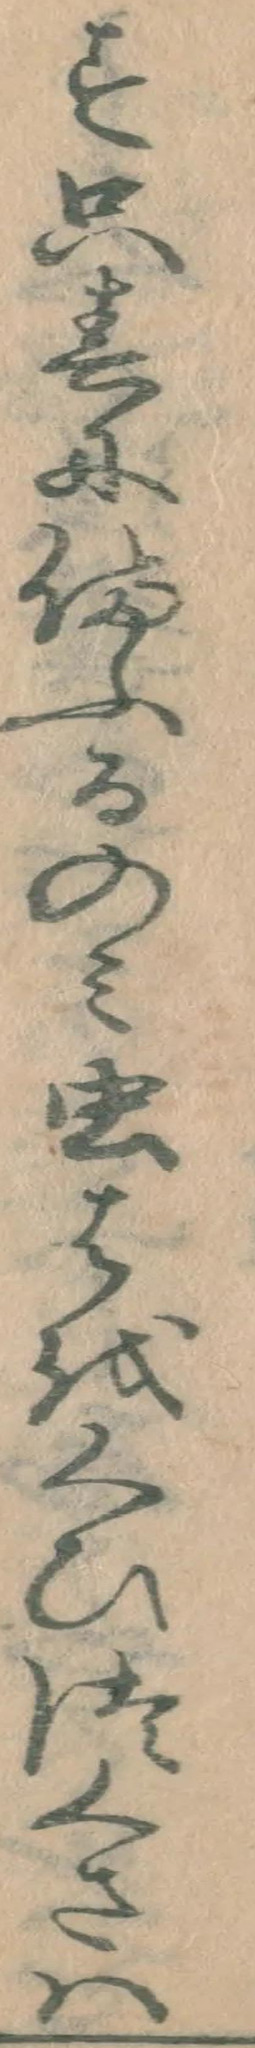す只春に備ふるのみむ虫はをくひつくさは
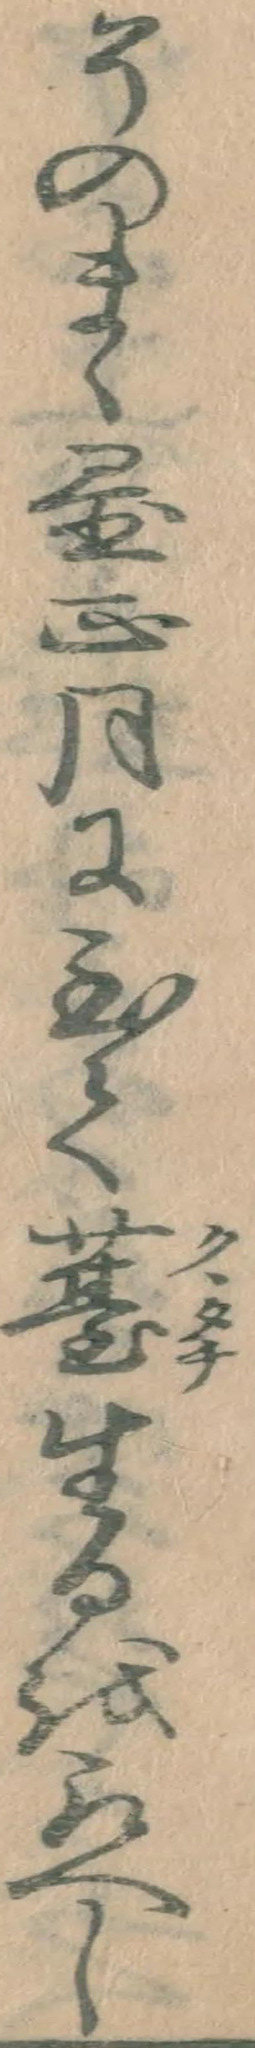そのまゝ置正月に至て薹生るを取へし
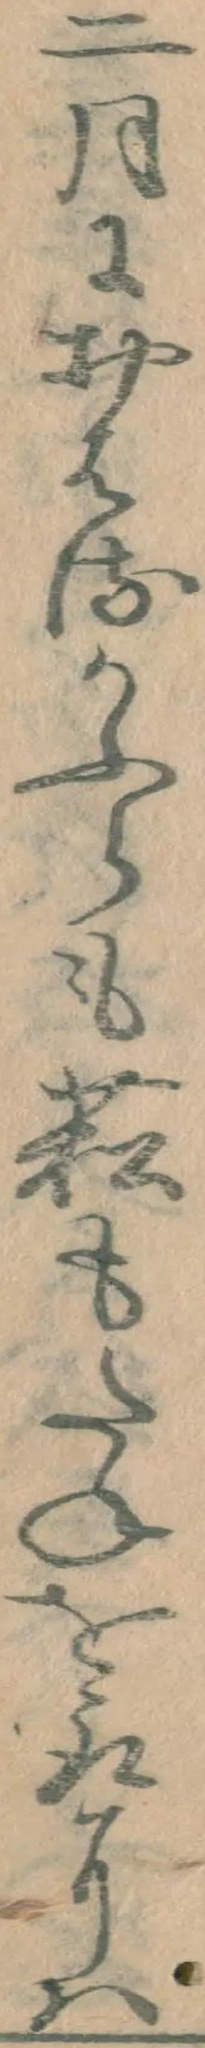二月におはるかふらも菘もたねを取には

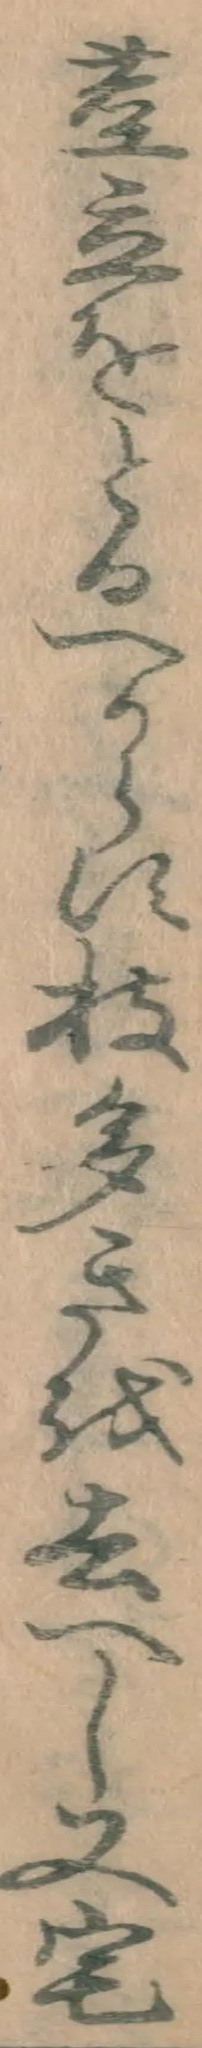茎立をとるへからす枝多きを去へし又宅
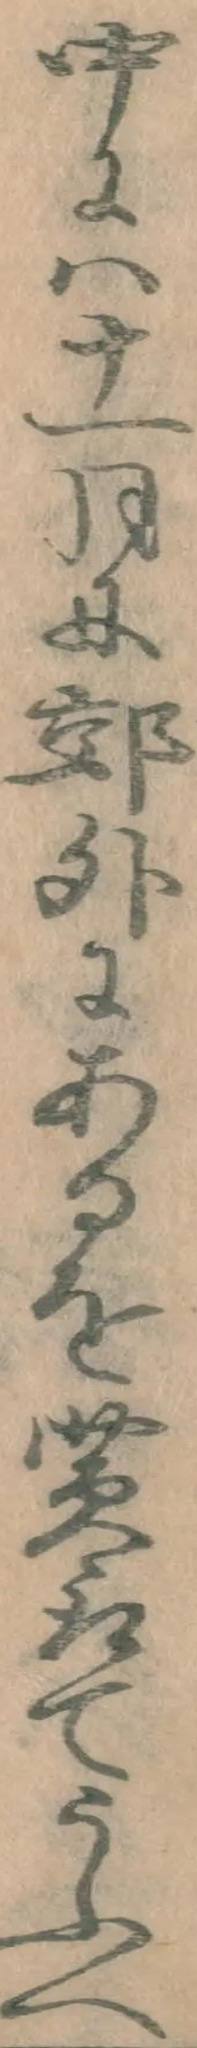中には十一月に郊外にあるを買取てうふへ
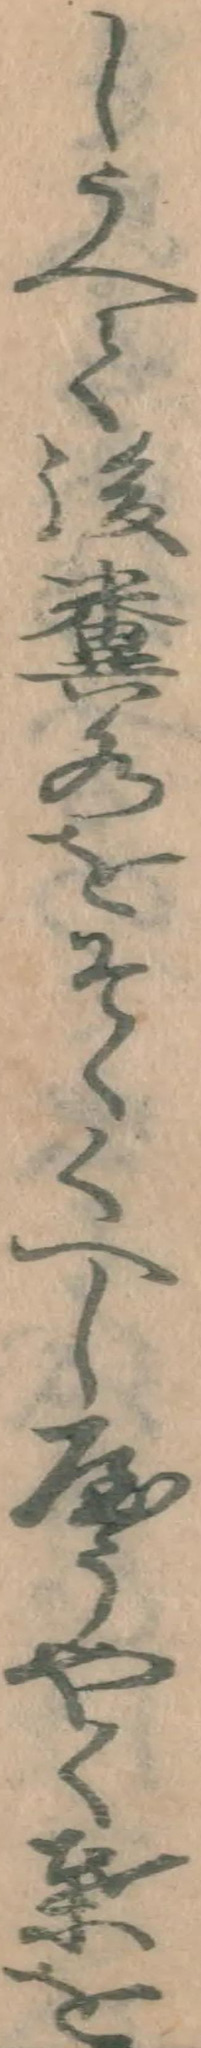しうへて後糞水をそゝくへしやうやく葉を
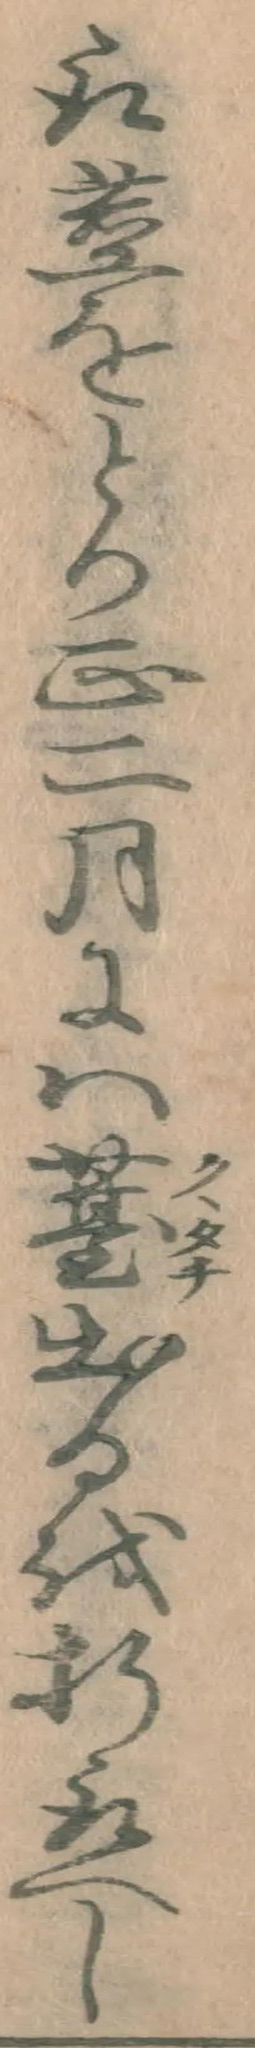取茎をとり正二月には薹出るを折取へし
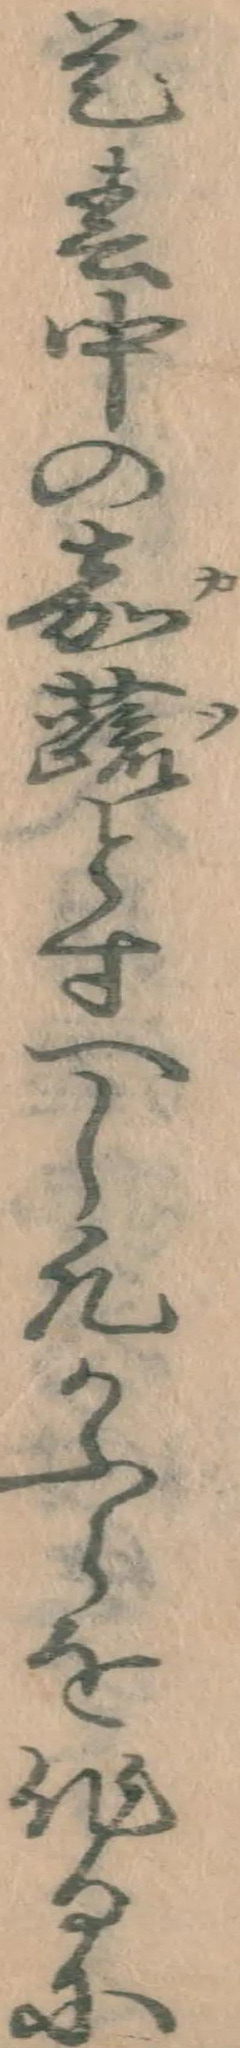是春中の嘉蔬とすへし凡かふらを作るに
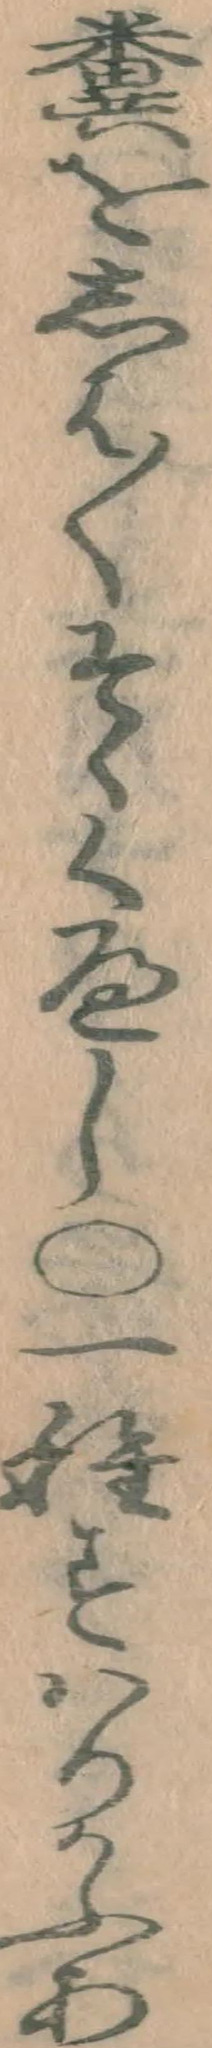糞をしは〳〵そゝくへし〇一種すはりかふあ
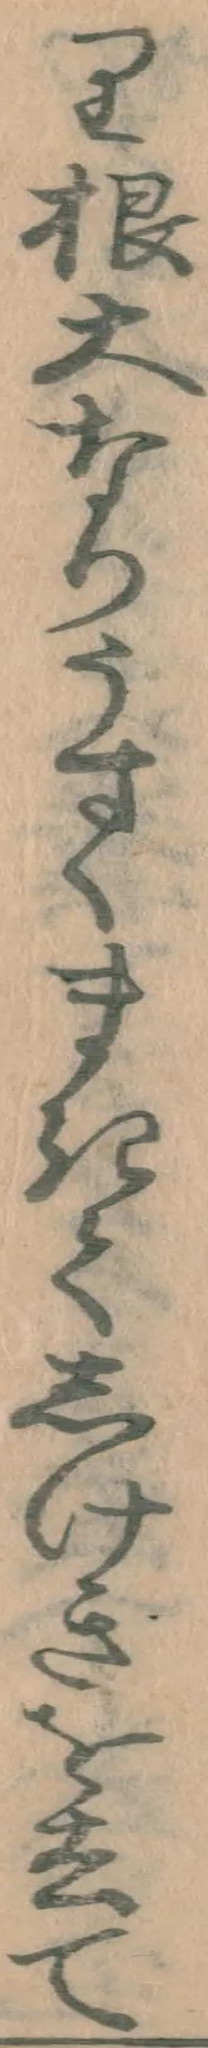り根大なりうすくまきてしけきを去て
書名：菜譜 3巻
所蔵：国立国会図書館 National Diet Library, JAPAN
